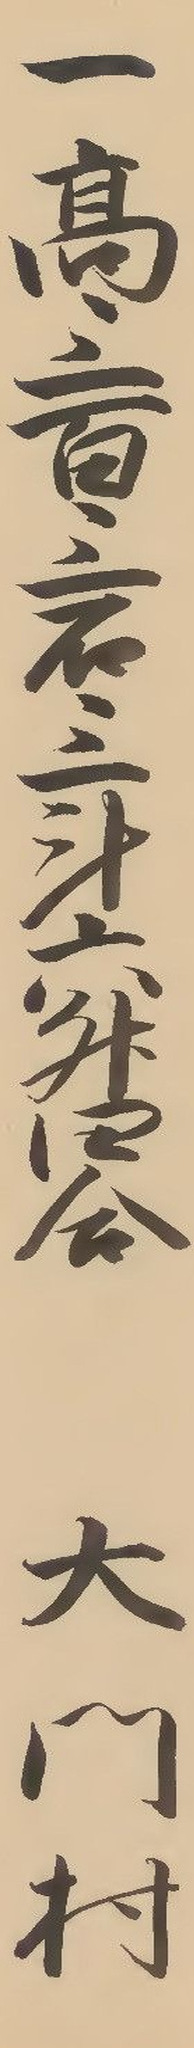一高三百三石三斗六升四合大門村
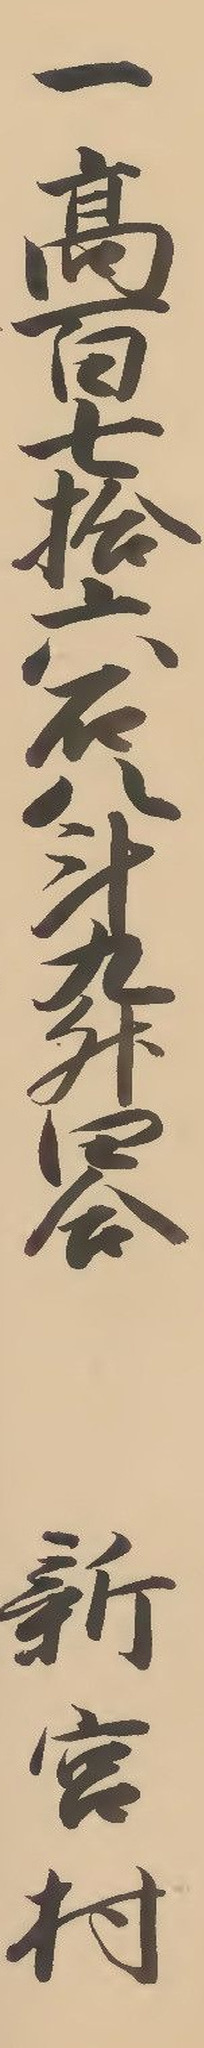一高百七拾六石八斗九升四合新宮村
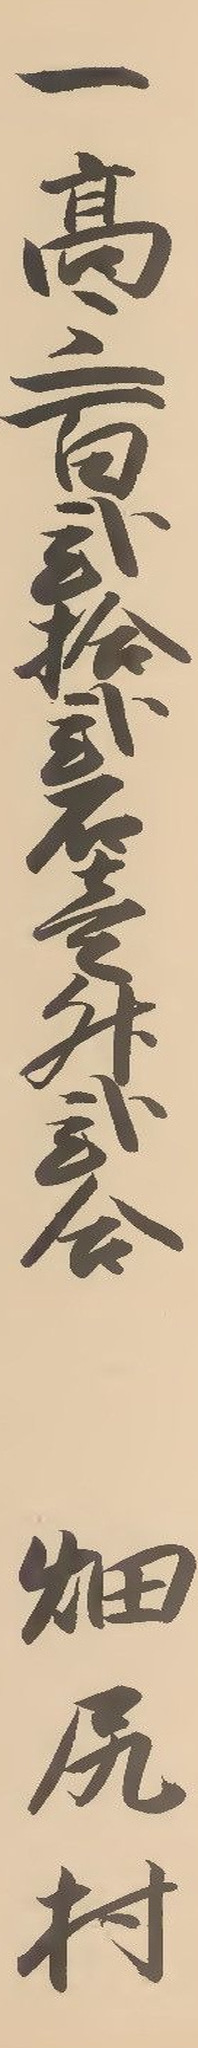一高三百弐拾弐石壱升弐合畑尻村
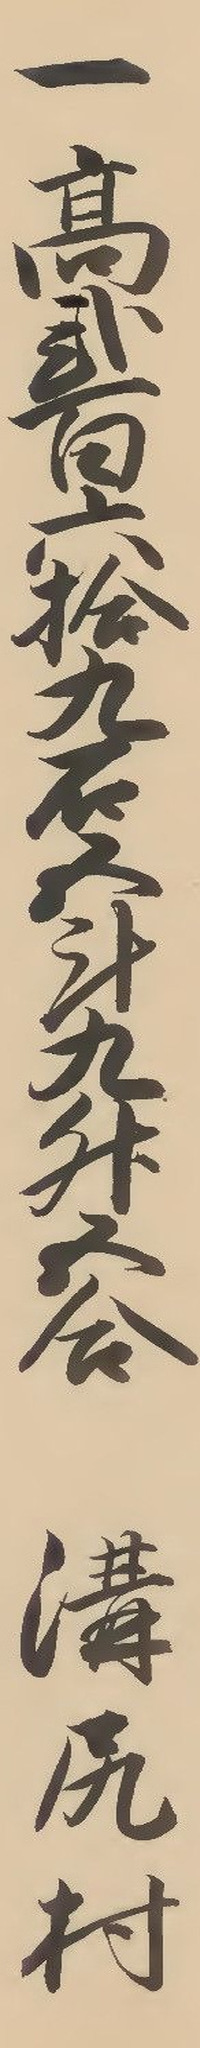一高弐百六拾九石五斗九升五合溝尻村
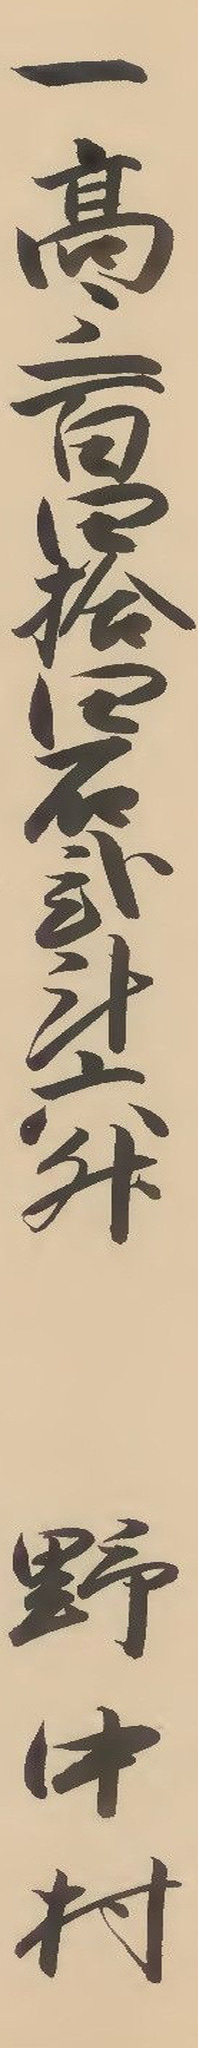一高三百四拾四石弐斗六升野中村

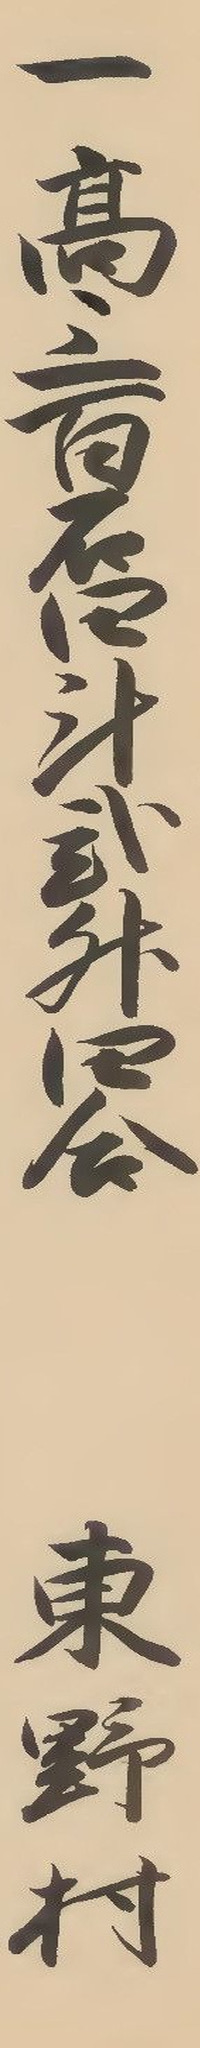一高三百石四斗弐升四合東野村
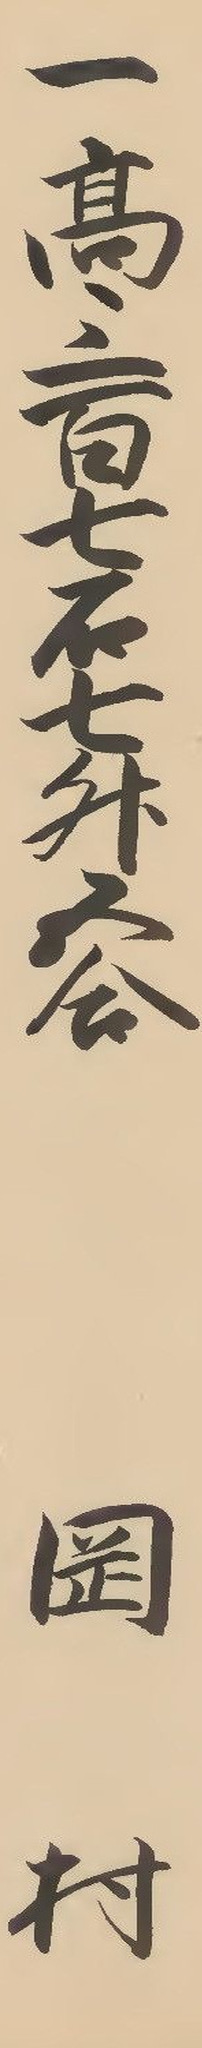一高三百七石七升五合岡村
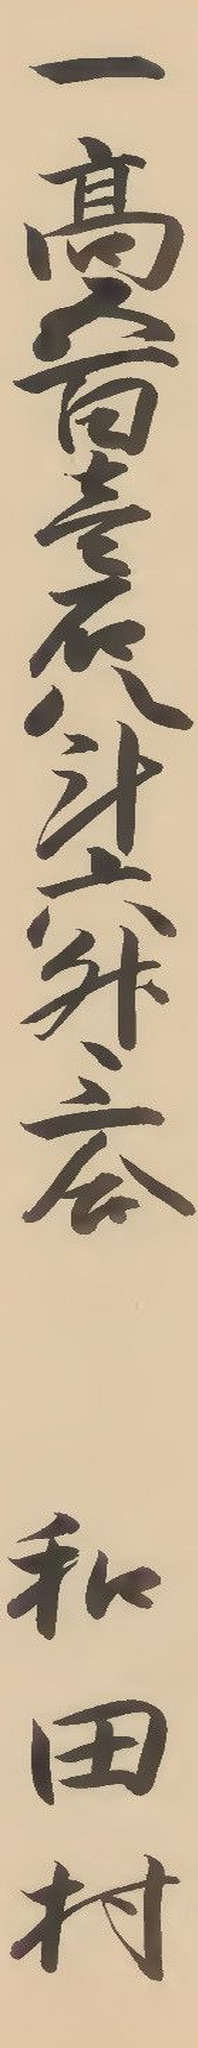一高五百壱石八斗六升三合和田村
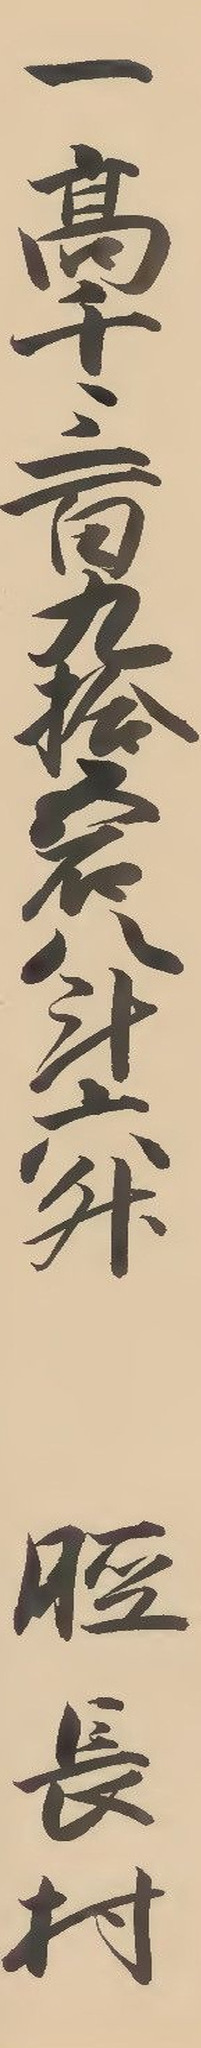一高千三百九拾五石八斗六升脛長村
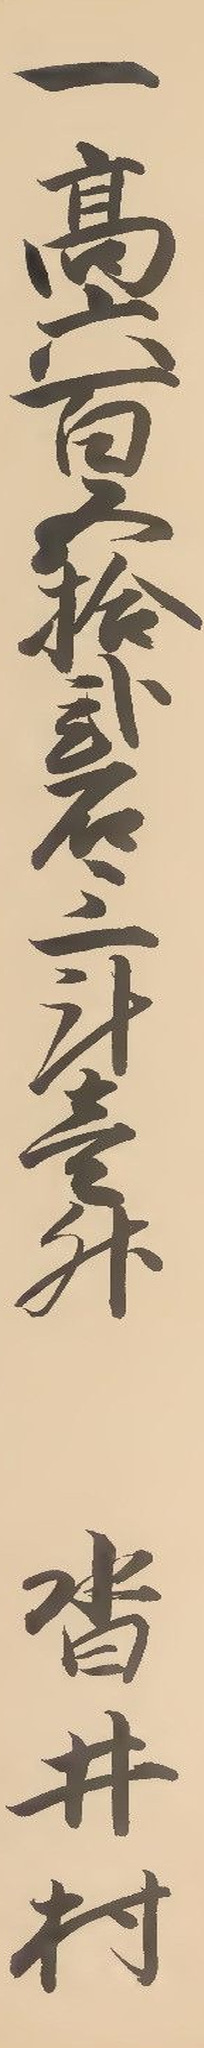一高六百五拾弐石三斗壱升沓井村
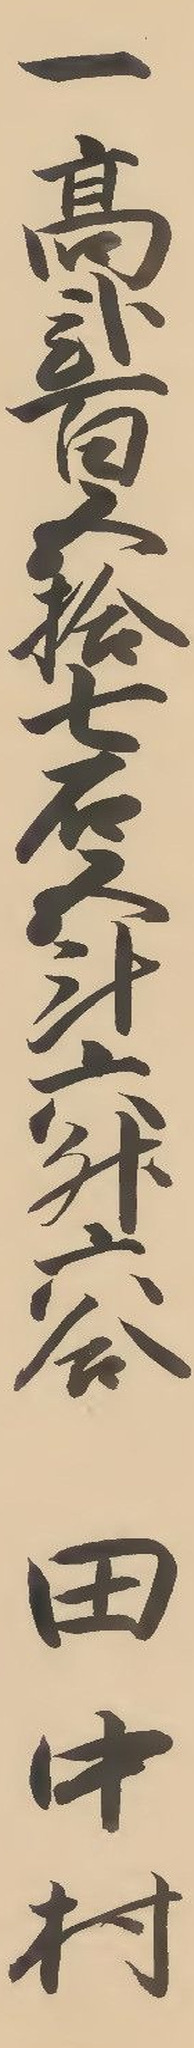一高弐百五拾七石五斗六升六合田中村

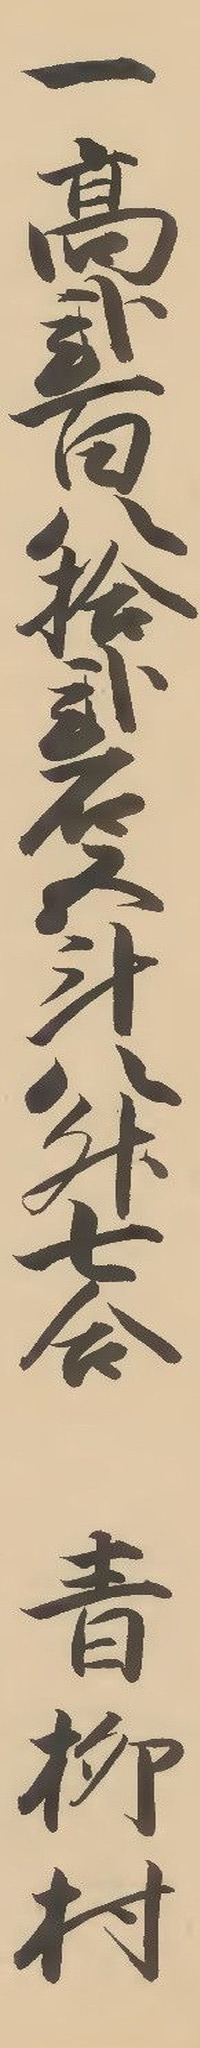一高弐百八拾弐石五斗八升七合青柳村
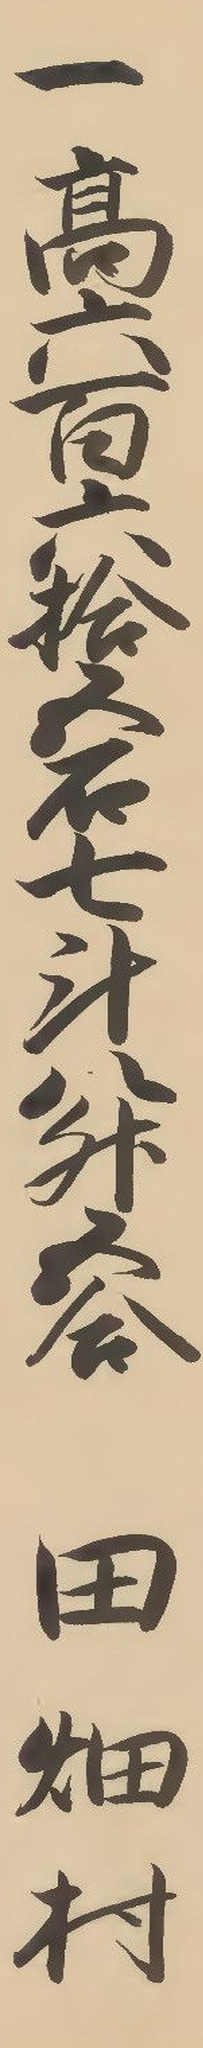一高六百六拾五石七斗八升五合田畑村
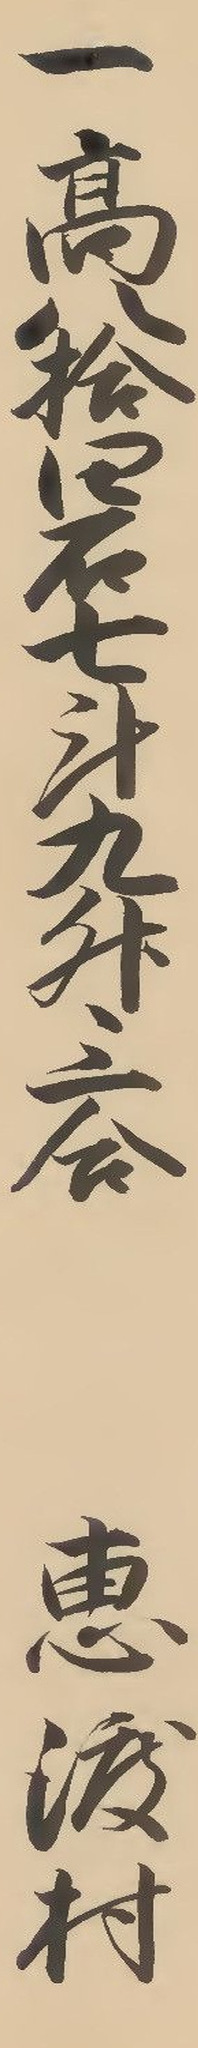一高八拾四石七斗九升三合恵渡村
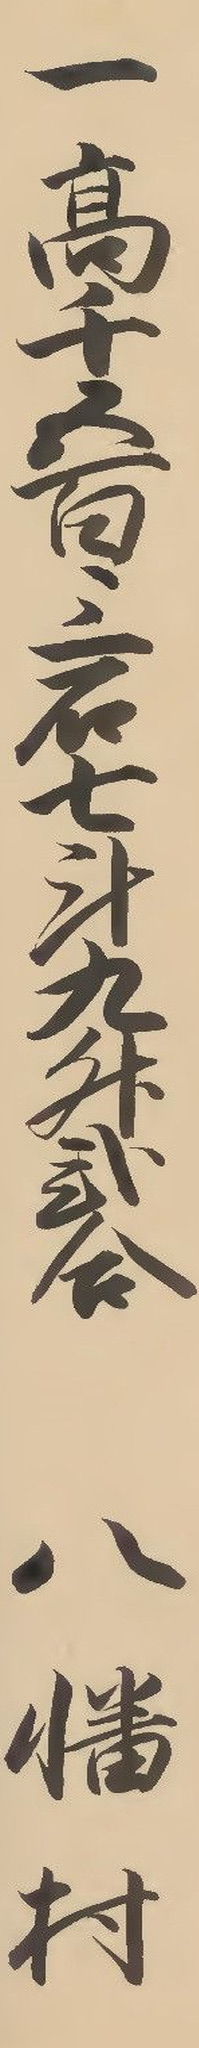一高千五百三石七斗九升弐合八幡村
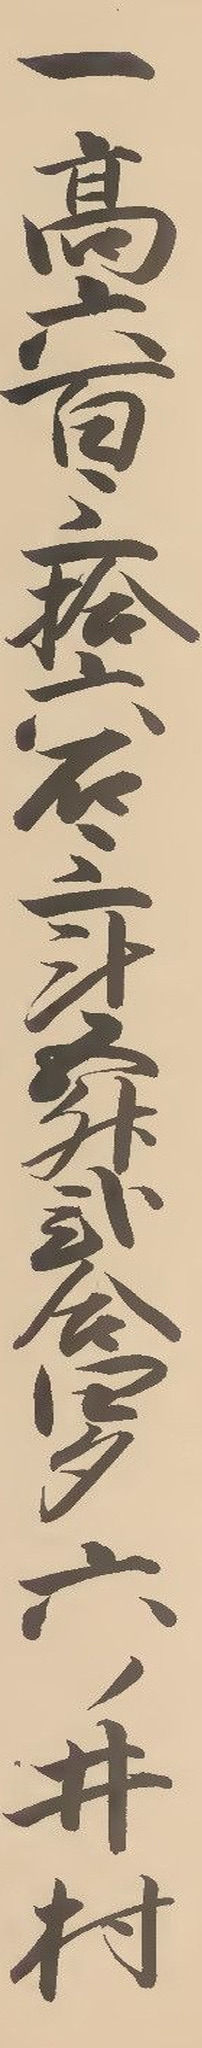一高六百三拾六石三斗五升弐合四勺六ノ井村
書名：美濃国郷帳
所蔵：国立公文書館 National Archives of Japan
